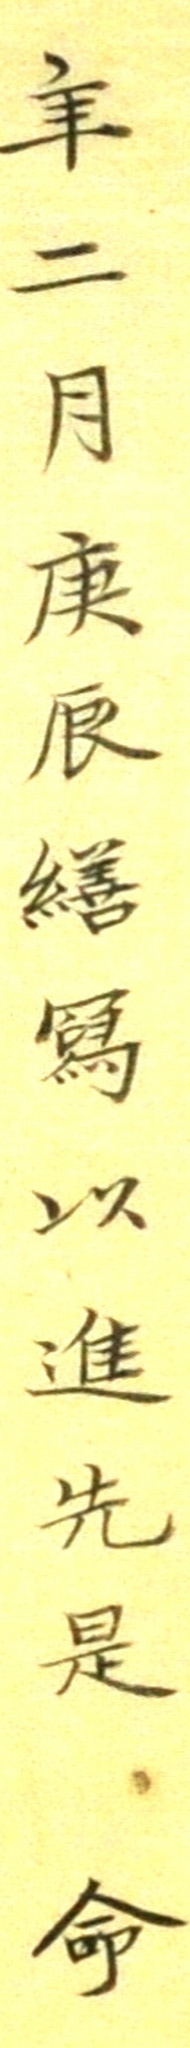年二月庚辰繕写以進先是命
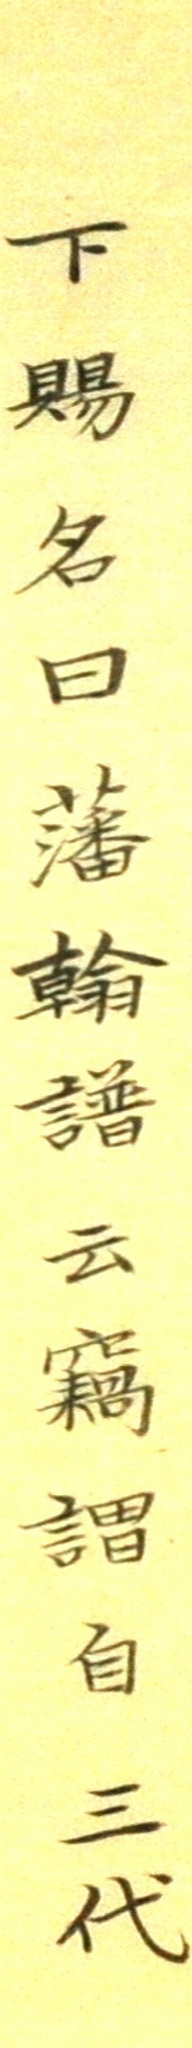下賜名曰藩翰譜云竊謂自三代
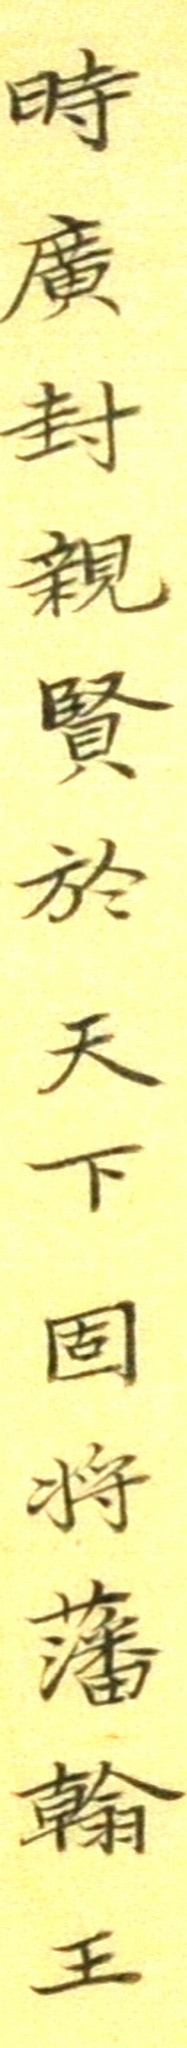時広封親賢於天下固将藩翰王
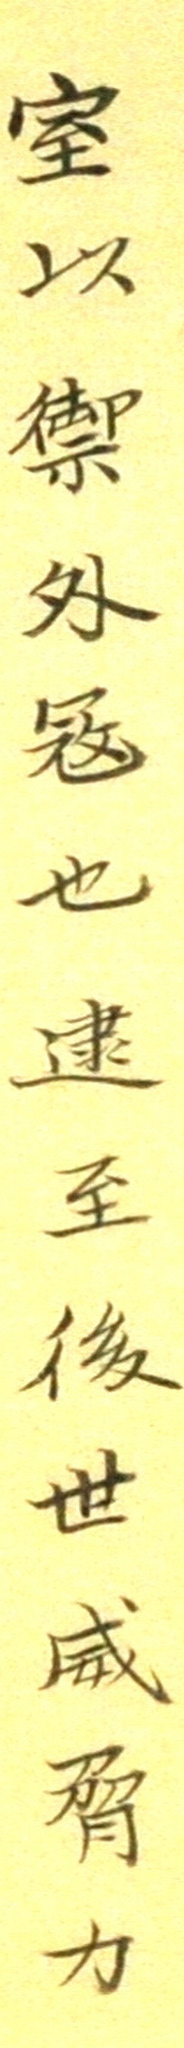室以禦外寇也逮至後世威脅力
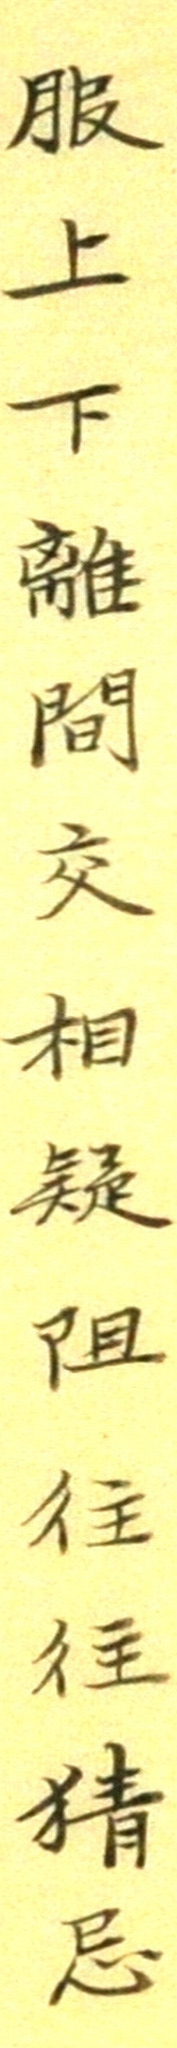服上下離間交相疑阻往往猜忌
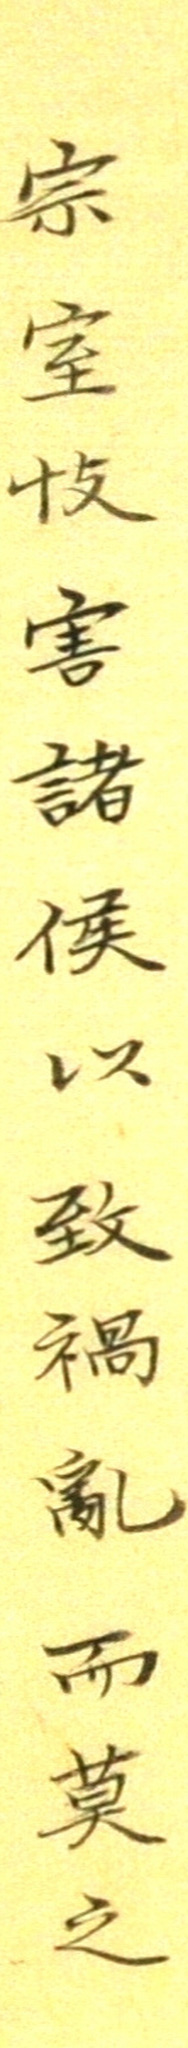宗室忮害諸侯以致禍乱而莫之
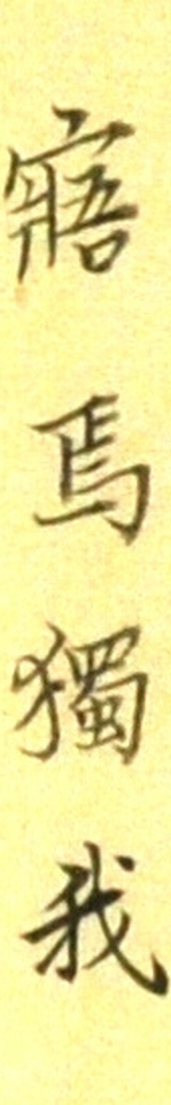寤焉独我
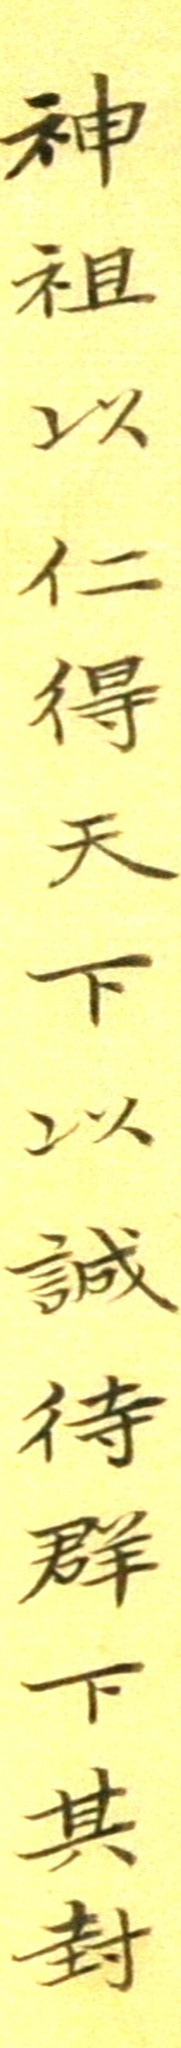神祖以仁得天下以誠待群下其封

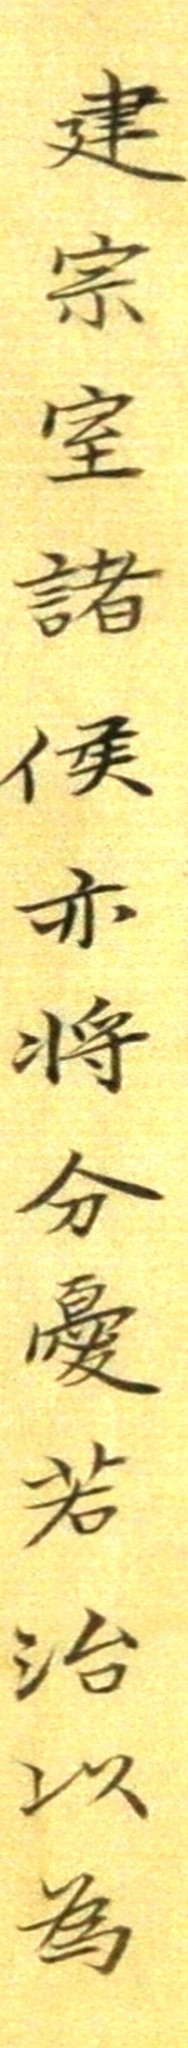建宗室諸侯亦将分憂若治以為
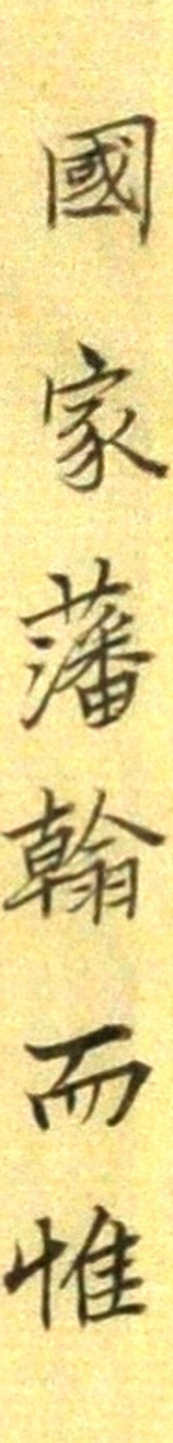国家藩翰而惟
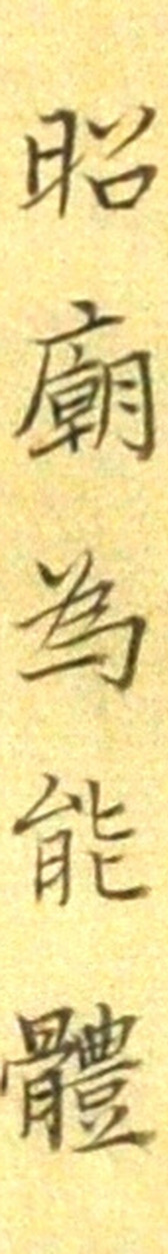昭廟為能体
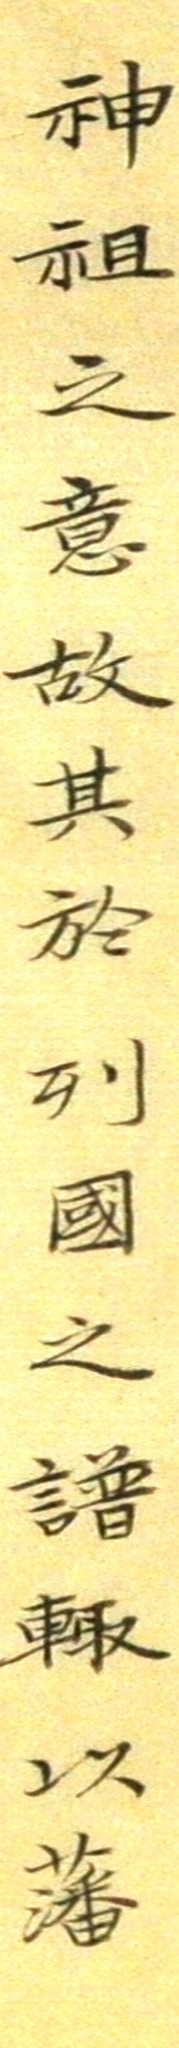神祖之意故其於列国之譜輙以藩
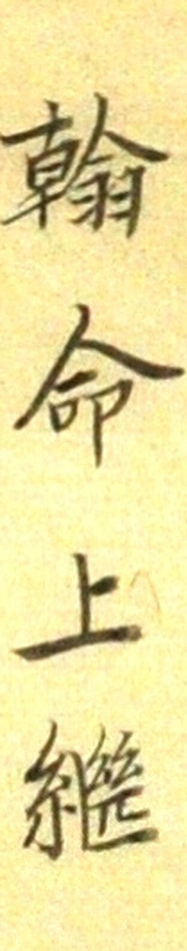翰命上継
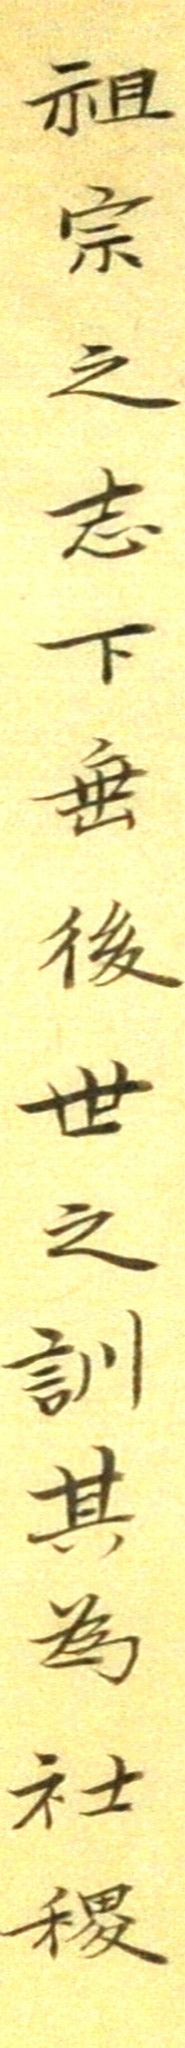祖宗之志下垂後世之訓其為社稷
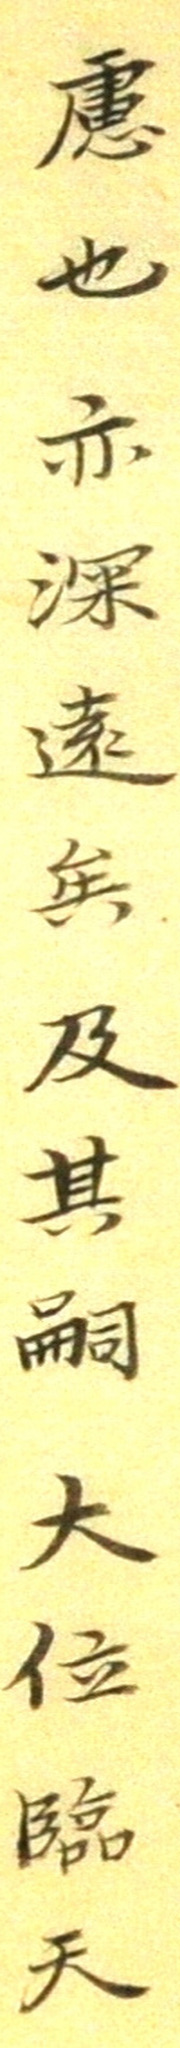慮也亦深遠矣及其嗣大位臨天
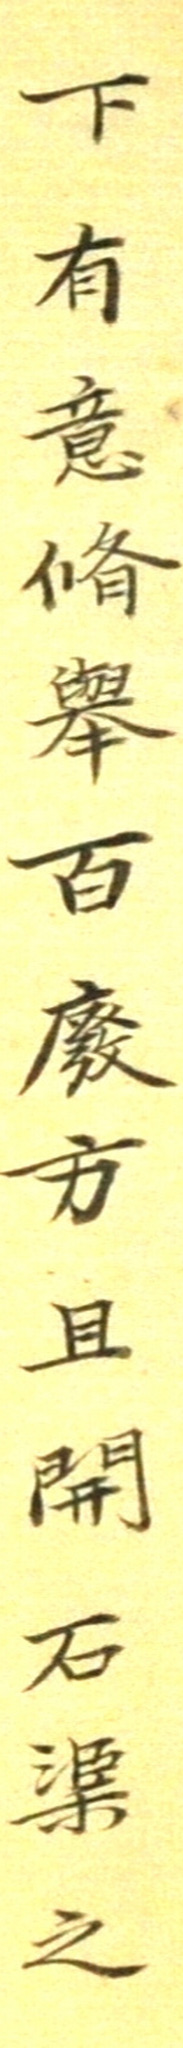下有意脩挙百廃方且開石渠之
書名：藩翰譜（一）
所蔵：伊那市立高遠町図書館・合同会社AMANE
